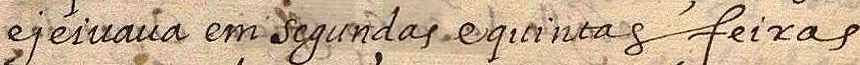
e jeiuaua em segundas e quintas feiras
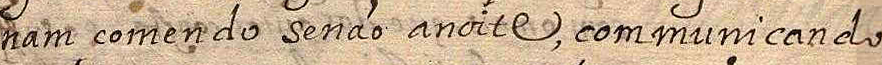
nam comendo senão a noite, communicando
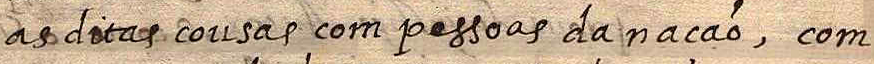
as ditas cousas com pessoas da nação, com
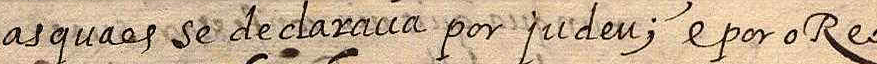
as quaes se declaraua por judeu; e por o Reo
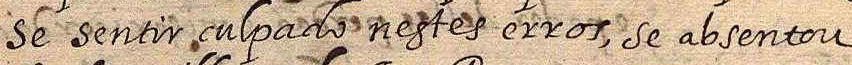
se sentir culpado nestes erros, se absentou
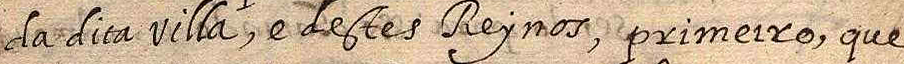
da dita villa, e destes Reynos, primeiro, que
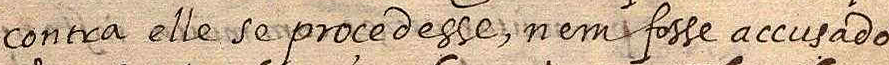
contra elle se procedesse, nem fosse accusado,
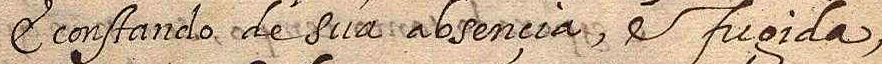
e constando de sua absencia, e fugida,
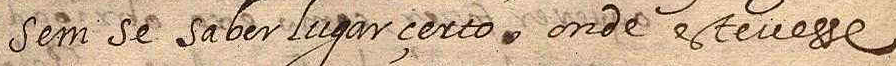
sem se saber lugar certo. onde esteuesse
